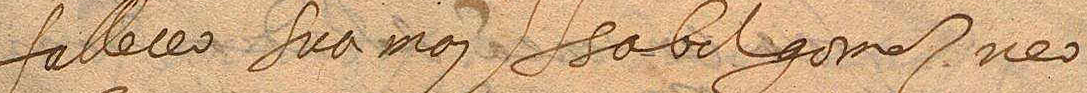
falleceo sua maj Jsabel gomez ueo
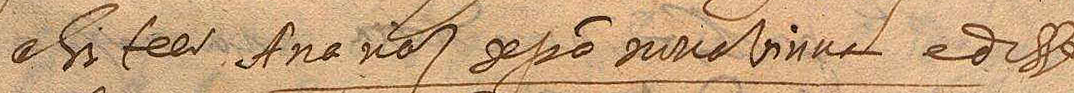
ahi teer Ana uaz xpā noua viuua e disse
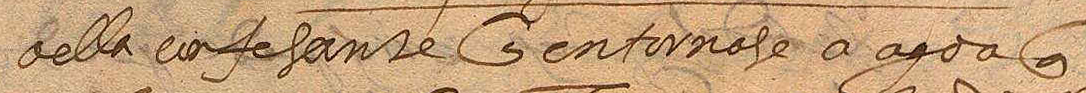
a ella confesante q̄ entornase a agoa q̄
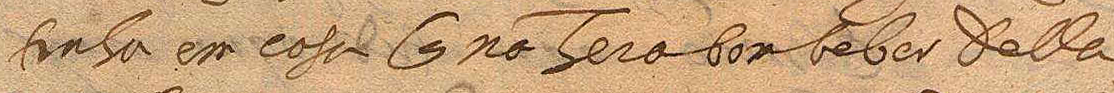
tinha em casa q̄ nā hera bom beber della
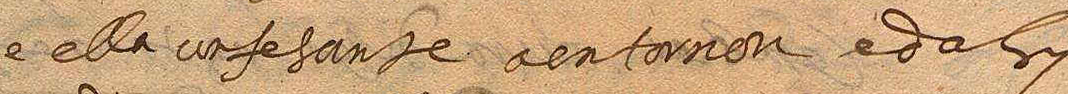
e ella confesante a entornou e dahy
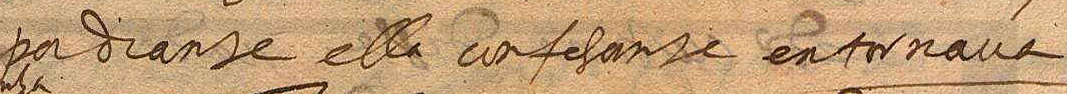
por diante ella confesante entornaua
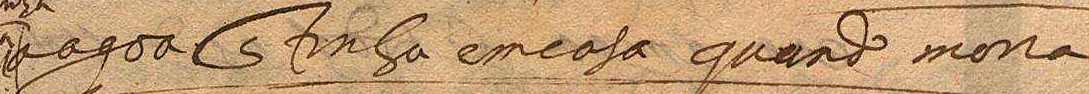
a agoa q̄ tinha em casa quando moria
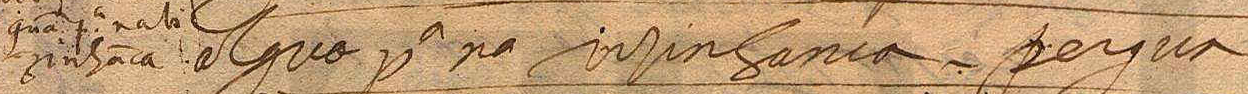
algua pa na vizinhanca. pergun
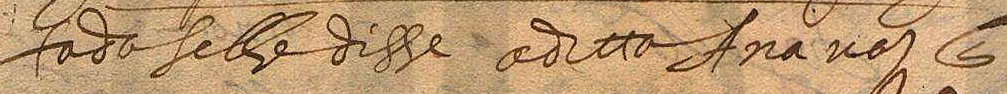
tada se lhe disse a ditta Ana uaz q̄
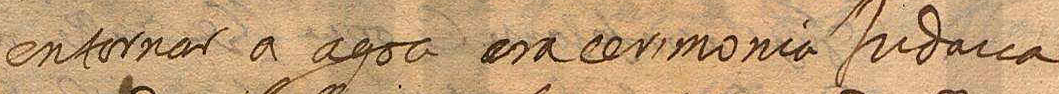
entornar a agoa era cerimonia Judaica
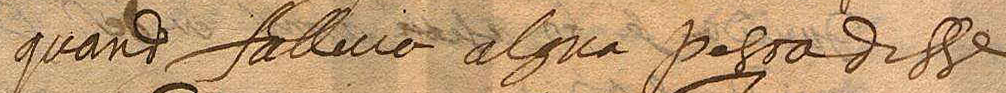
quando fallecia algua pesoa disse
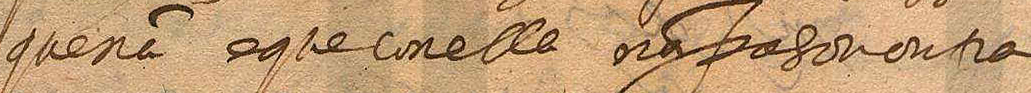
que nā e que con ella nā pasou outra
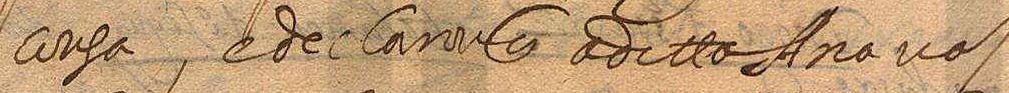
cousa, e declarou q̄ a ditta Ana uaz
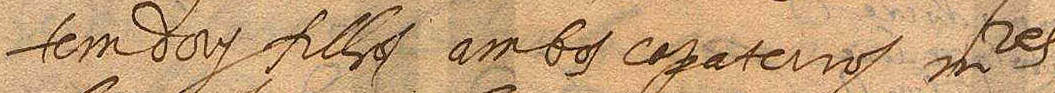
tem dous filhos ambos capateiros mres
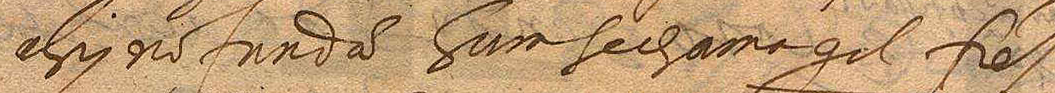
ahy no fundão hum se chama gil frēz
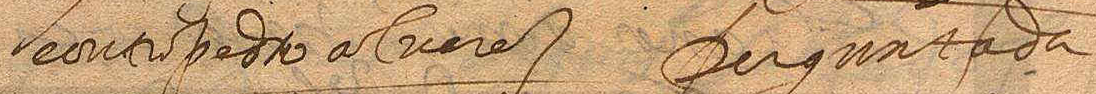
e outro pedro aluares Perguntada
